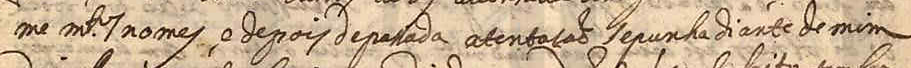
me mtos nomes, e depois de passada a tentaçaõ se punha diante de mim
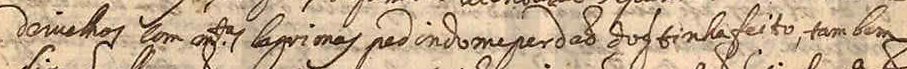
de iuelhos com m.tas lagrimas pedindome perdaõ do q̄ tinha feito, tambem
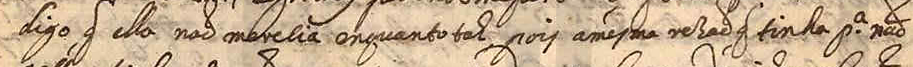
digo, q̄ ella naõ merecia enquanto tal, pois a mesma rezaõ q̄ tinha p.a naõ
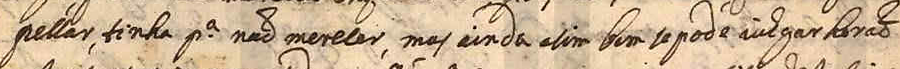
peccar tinha p.a naõ merecer, mas ainda asim bem se pode iulgar heraõ
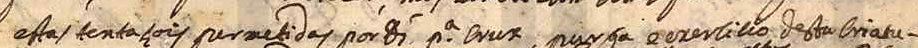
estas tentaçois permetidas por Ds̄, p.a Cruz, purga, e exercicio desta Criatu
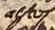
actos
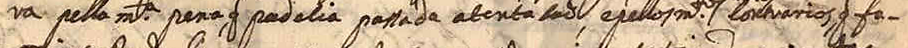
ra pella m.ta pena, q̄ padecia passada a tentaçaõ, e pellos m.tos Contrarios q̄ fa
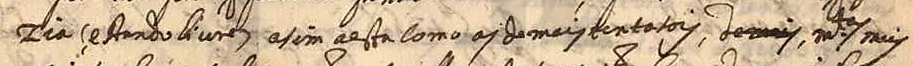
zia, (estando liure) asim a esta como as demais tentasois, de mais, m.tas mais
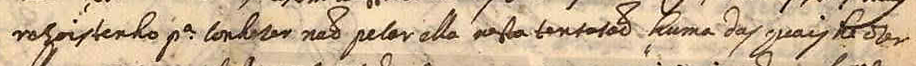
rezois tenho p.a conheser naõ pecar ella nesta tentasaõ huma das quais he o ser
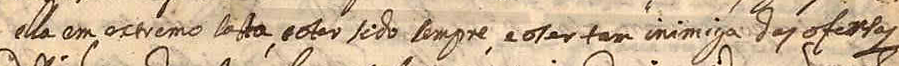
ella em extremo Casta, e o ter sido sempre, e o ser tam inimiga das ofensas
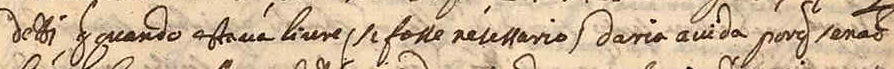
de Ds̄, q̄ quando estaua liure (se fosse necessario) daria a uida por q̄ se naõ
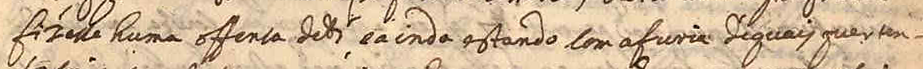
fizesse huma offensa de Ds̄, e ainda estando com a furia de quaisquer ten
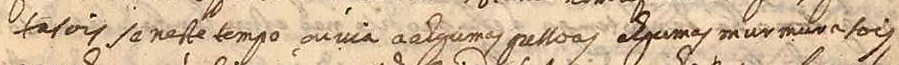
tasois se neste tempo ouuia a algumas pessoas algumas murmurasois,
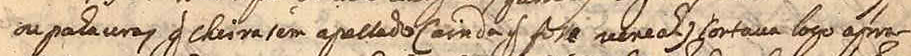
ou palauras q̄ cheirasem a peccado (ainda q̄ fosse ueneal) Cortaua logo a pra
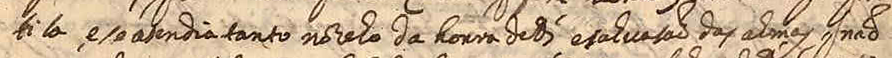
tica, e se asendia tanto no zelo da honra de Ds̄, e saluaçaõ das almas, q̄ naõ
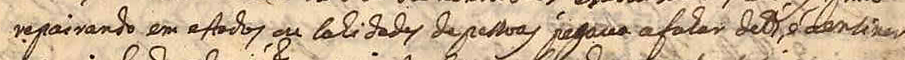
repairando em estados, ou calidades de pessoas pegaua a falar de Ds̄, e ensinar
